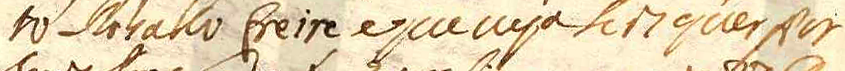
to Robalo freire, e que ueja se os quer por
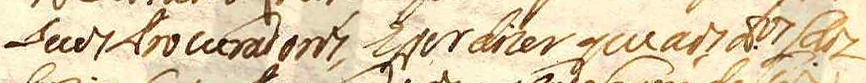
seus Procuradores, e por dizer, que aos d̄.os L.dos
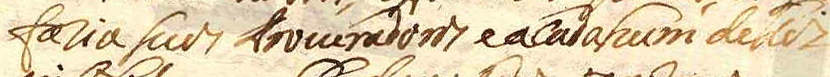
fazia seus Procuradores e a cada hum delles
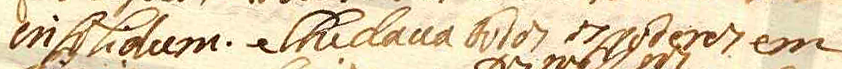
in solidum. e lhe daua todos os poderes em
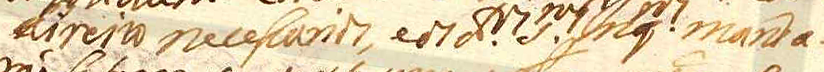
direito necessarios, e os d̄.os s.res Jnqres. manda
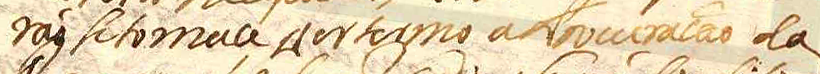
raõ se tomaçe por termo a Procuraçaõ da
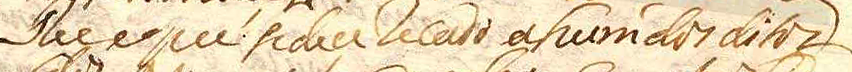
Ree e que se deçe Recado a hum dos ditos
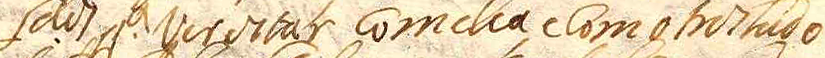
Ld.os p.a ver estar com ella, e com o treslado
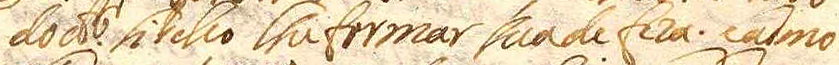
do d̄o. libello lhe formar sua defeza. e admo
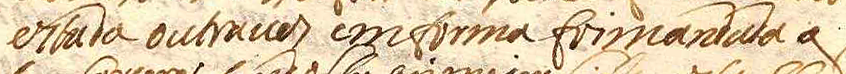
estada outra ues em forma foi mandada a
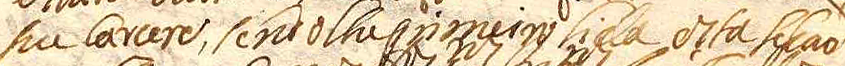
seu carcere, sendolhe primeiro lida esta sessaõ
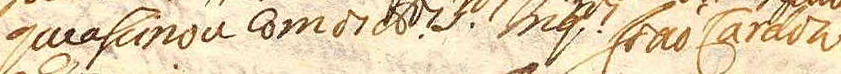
que assinou com os d̄.os s.res Inq.res Joaõ Cardozo
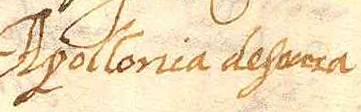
Apollonia de souza
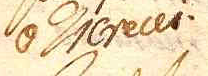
o Escreui.
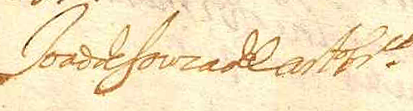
Joaõ de souza d̄ casto brc.o
